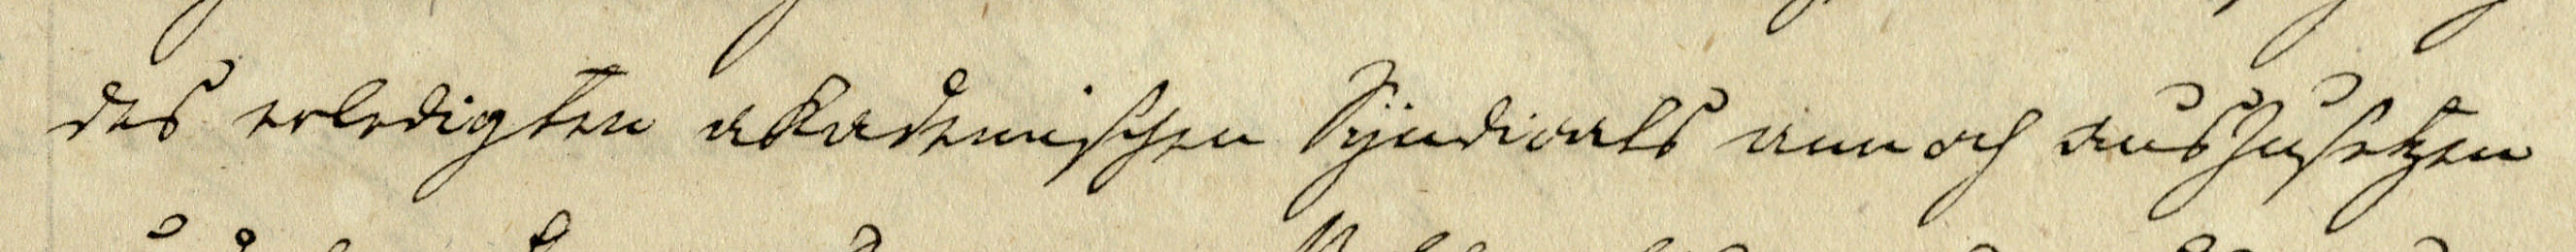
des erledigten akademischen Sÿndicats annoch auszusetzen
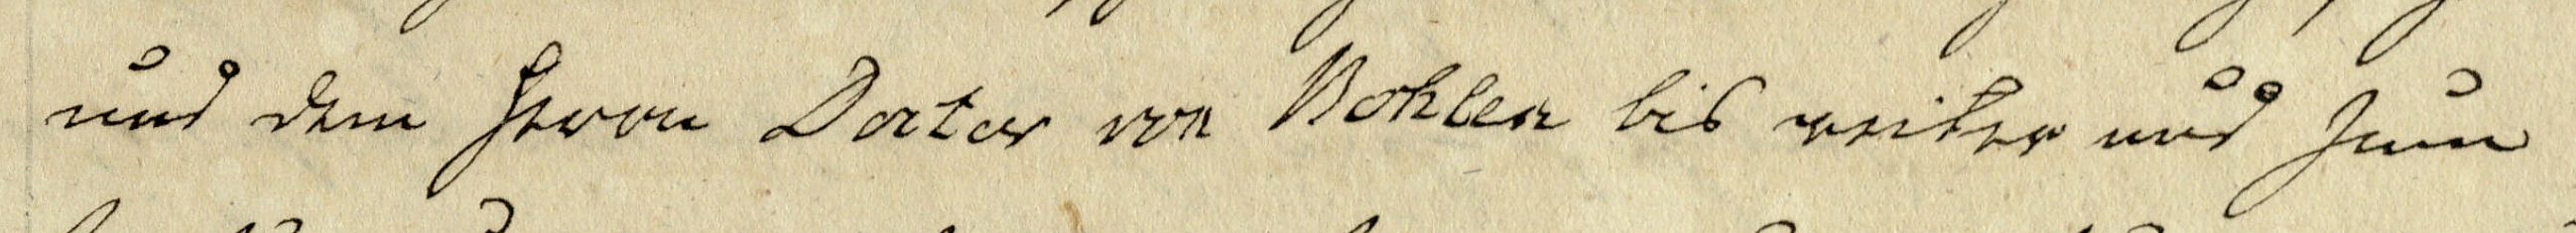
und dem Herrn Doctor von Bohlen bis weiter und zum
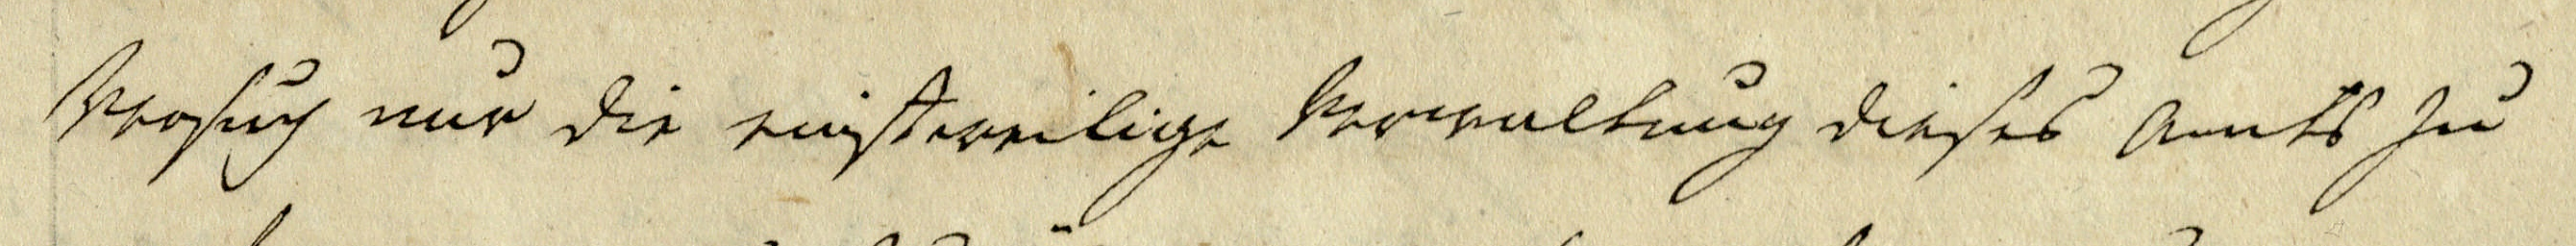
Versuch nur die einstweilige Verwaltung dieses Amts zu
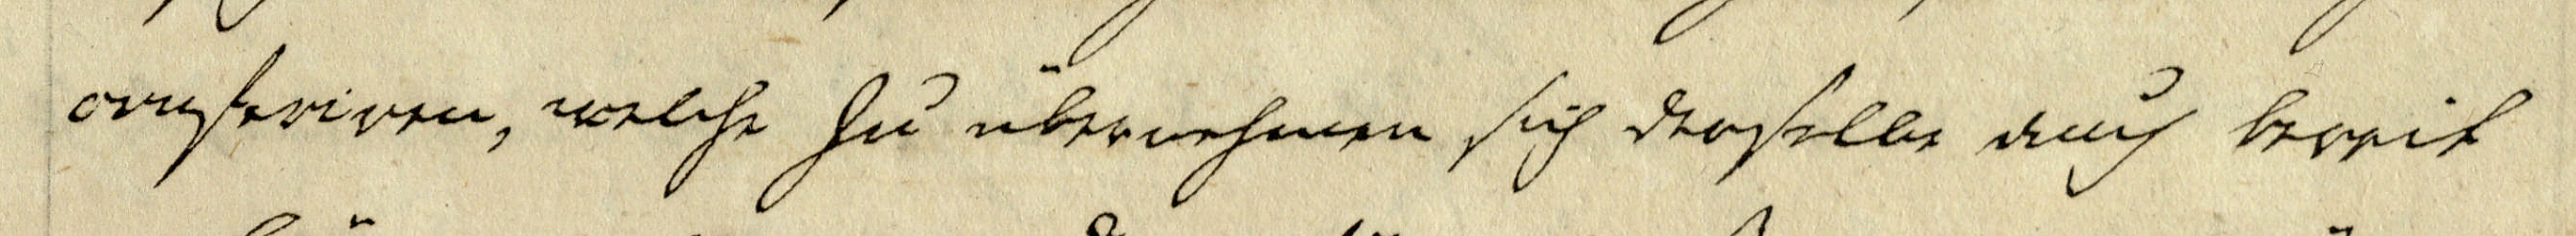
conferiren, welche zu übernehmen sich derselbe auch bereit
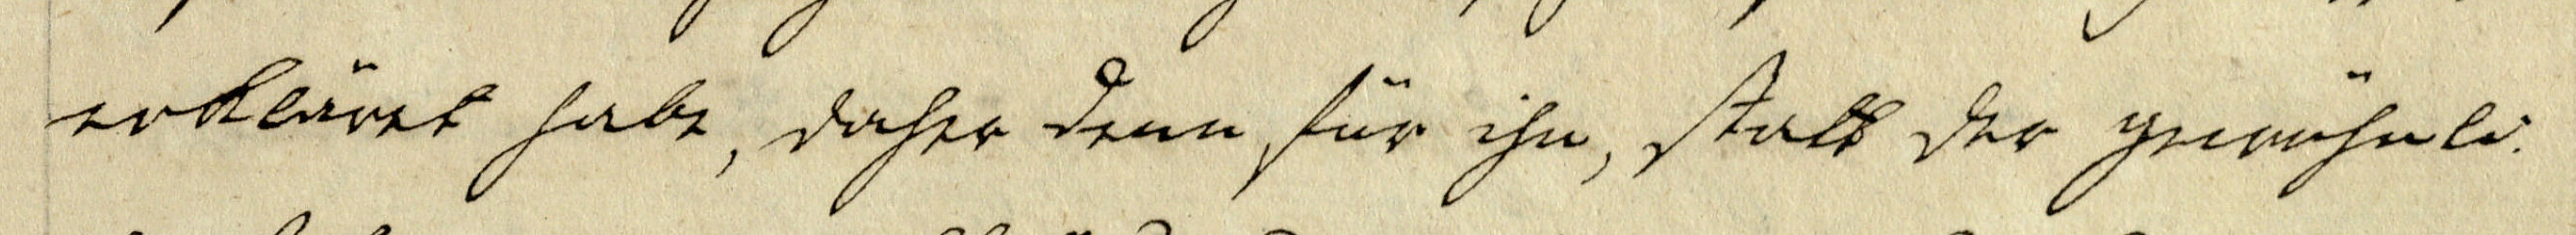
erkläret habe, daher denn für ihn, statt der gewöhnli¬
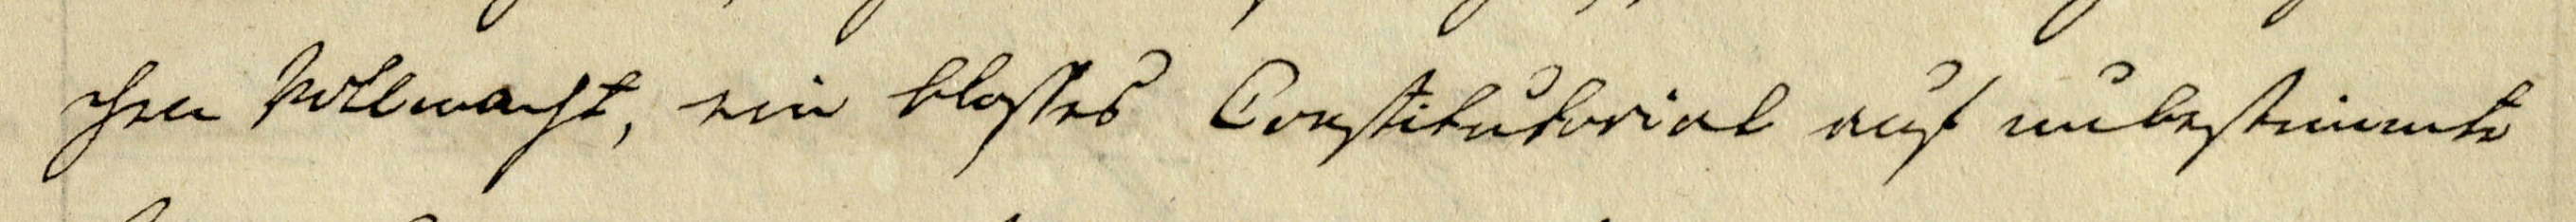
chen Vollmacht, ein blosses Constitutorial auf unbestimmte
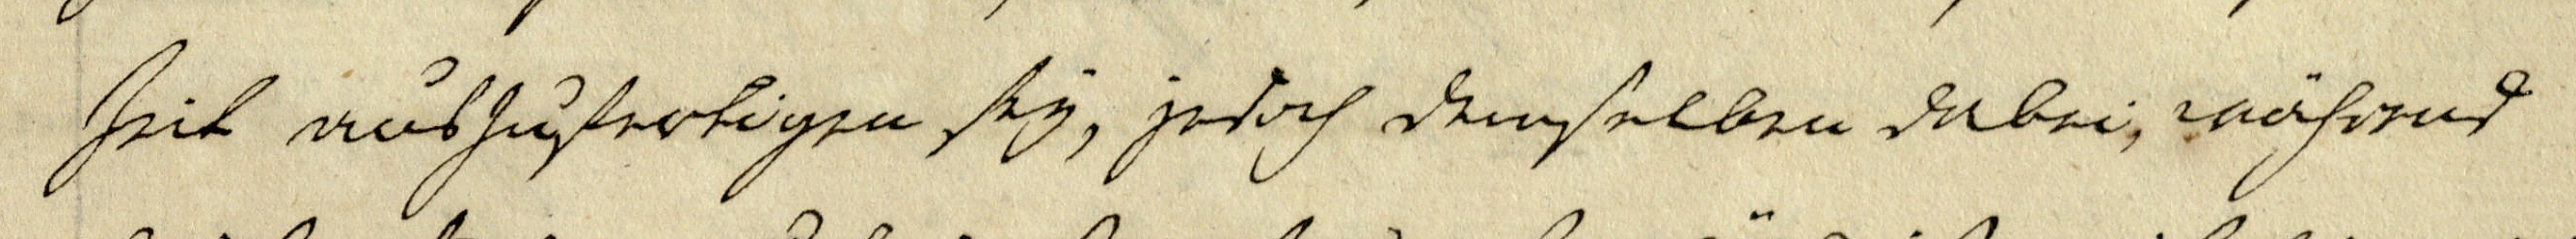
Zeit auszufertigen seÿ, jedoch demselben dabei, während
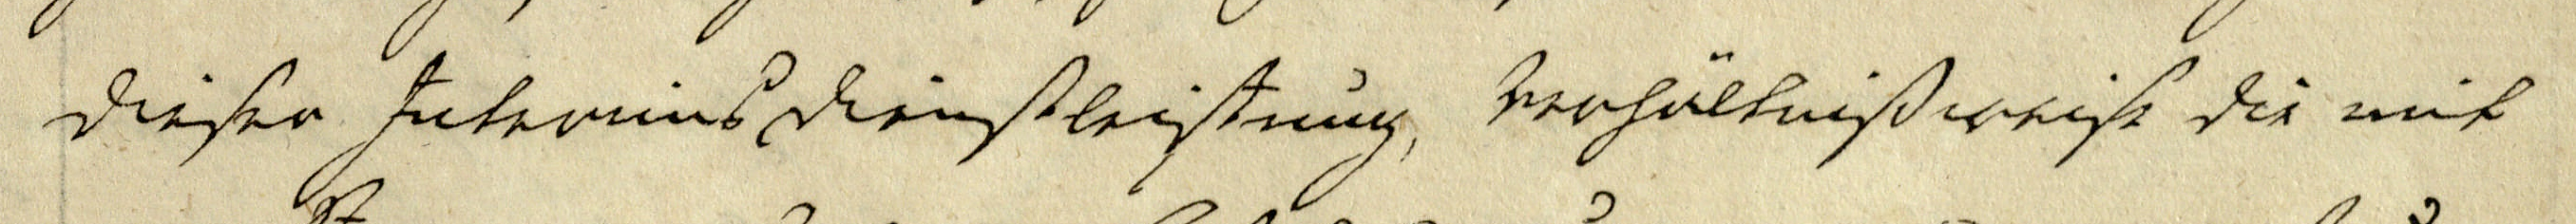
dieser Interimsdienstleistung, Verhältnißweise die mit
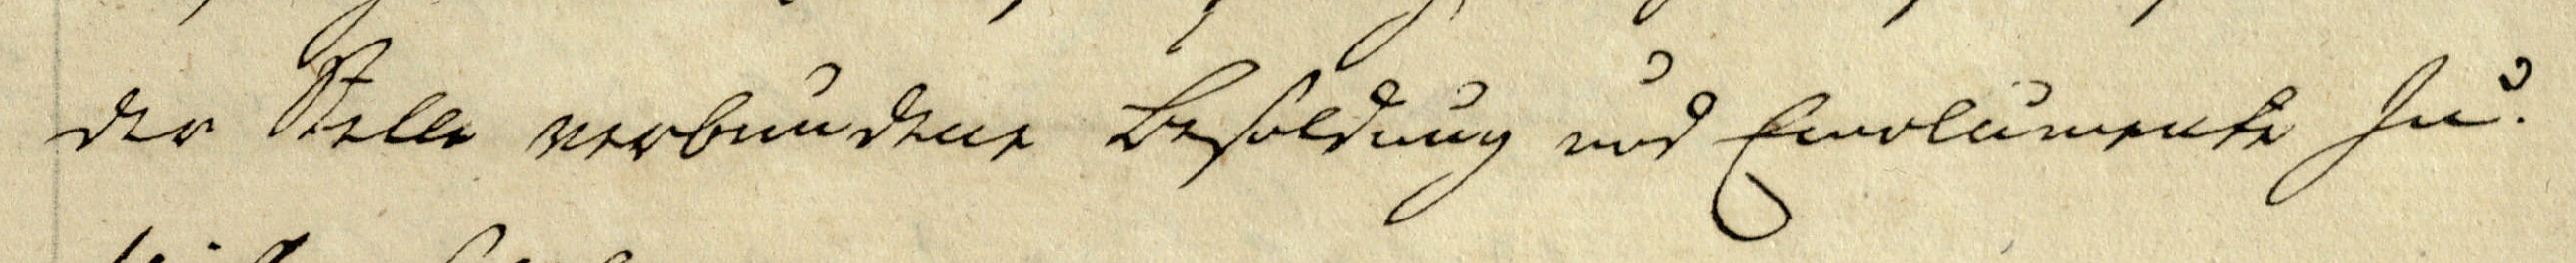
der Stelle verbundene Besoldung und Emolumente zu¬
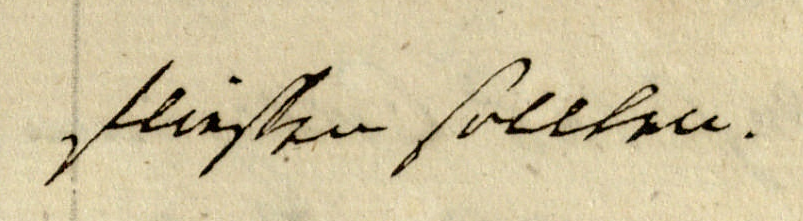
fliessen sollten.
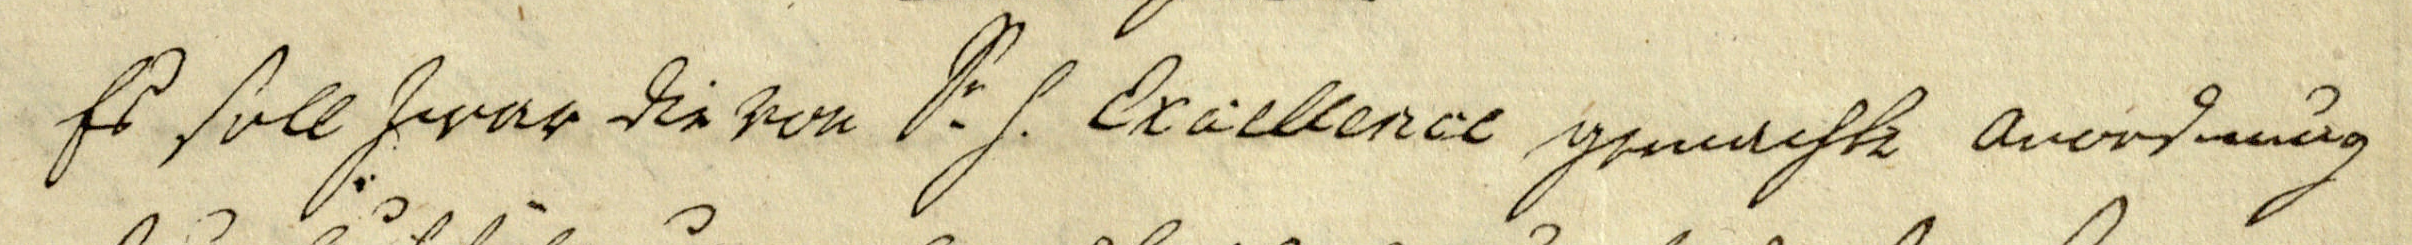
Es soll zwar die von Sr. h. Excellence gemachte Anordnung
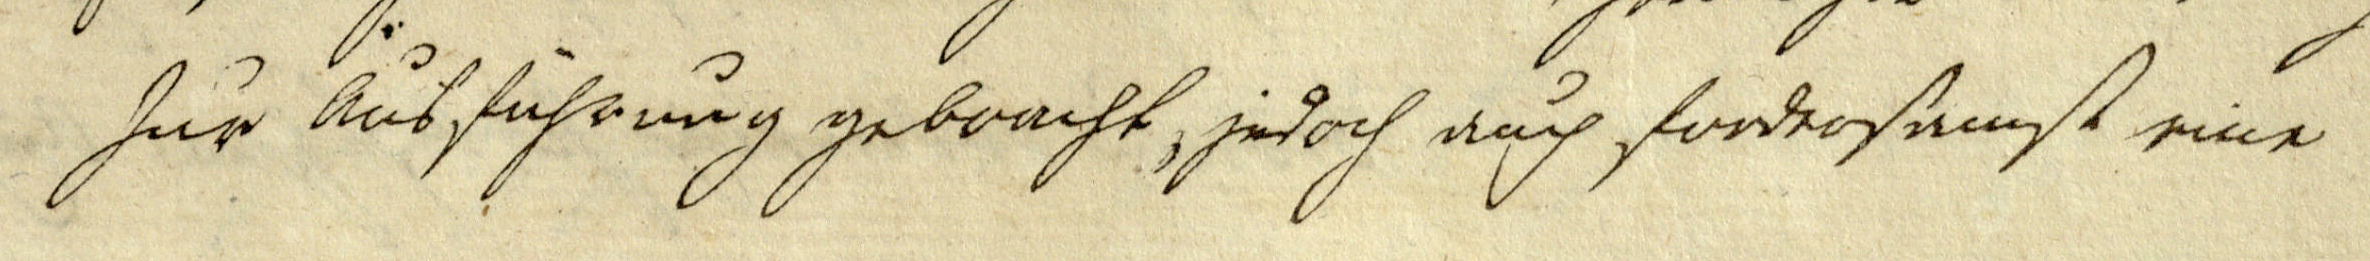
zur Ausführung gebracht, jedoch auch fordersamst eine
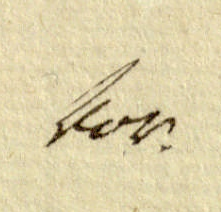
Vor
